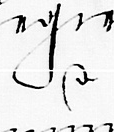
der
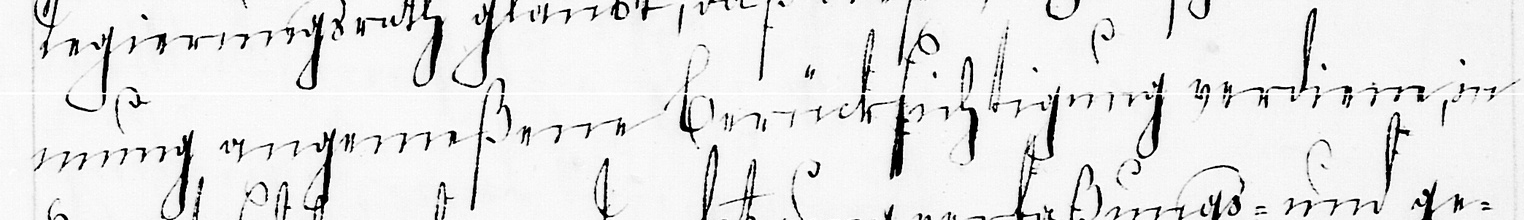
mung angemeßene Berücksichtigung verdiene, in
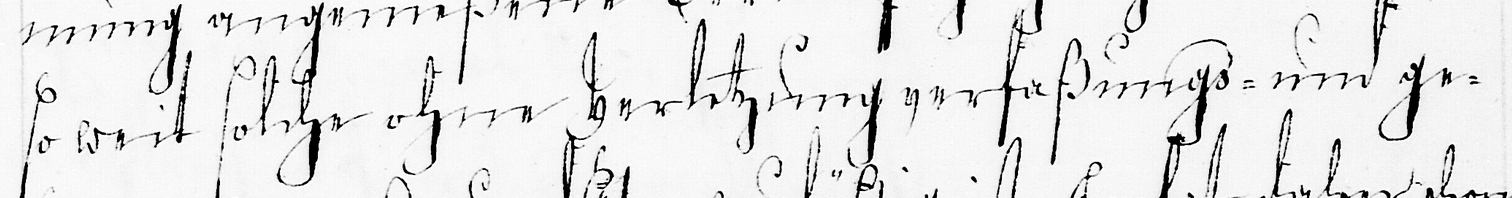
so weit solche ohne Verletzung verfaßungs- und ge¬
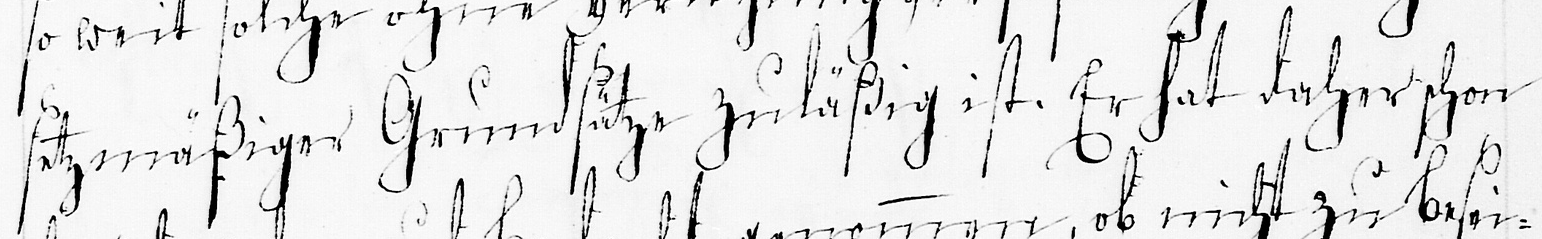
setzmäßiger Grundsätze zuläßig ist. Er hat daher schon
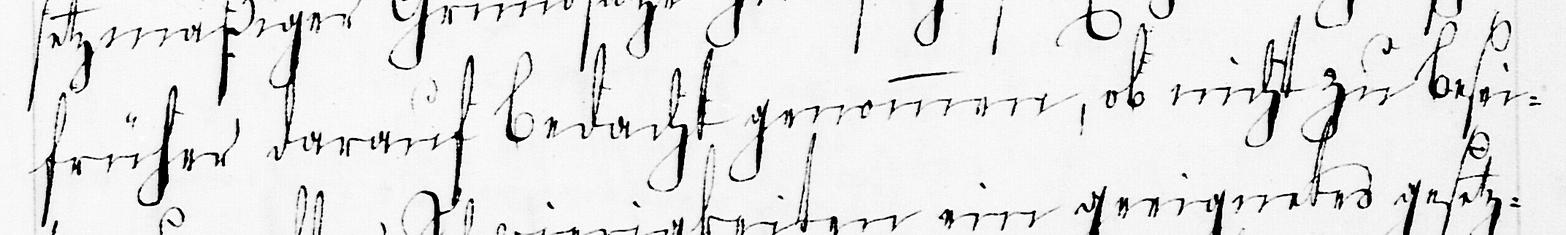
früher darauf Bedacht genommen, ob nicht zu Besei¬
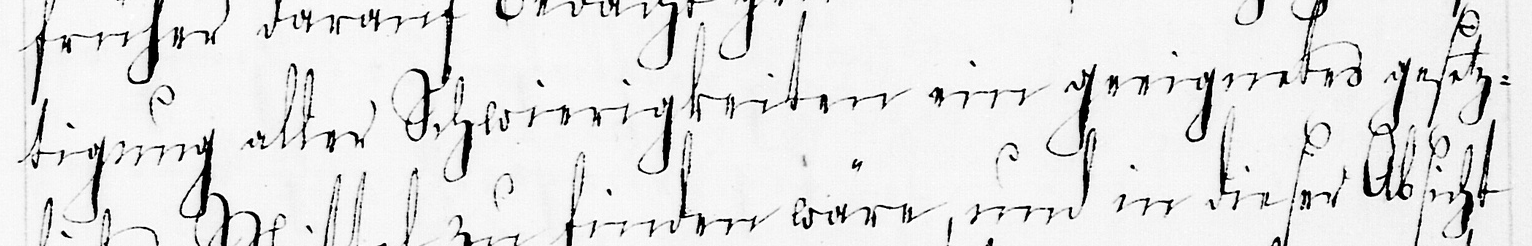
tigung aller Schwierigkeiten ein geeignetes gesetz¬
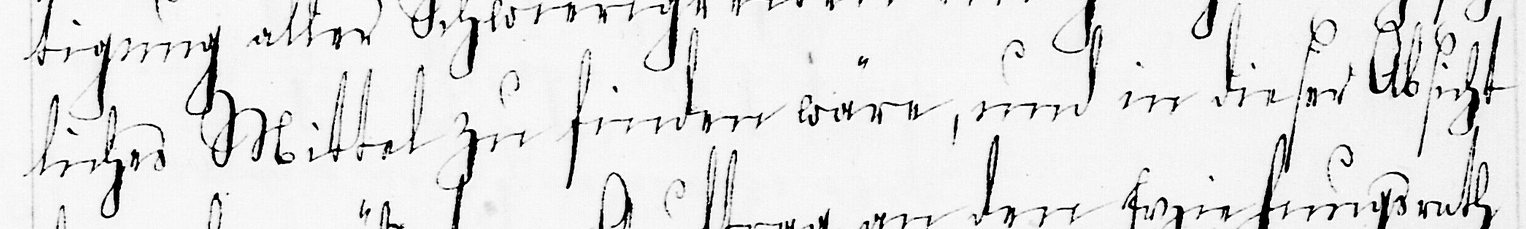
liches Mittel zu finden wäre, und in dieser Absicht
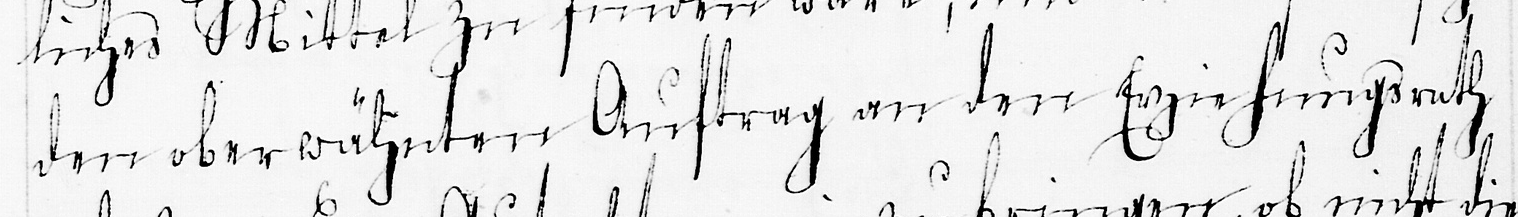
den oberwähnten Auftrag an den Erziehungsrath
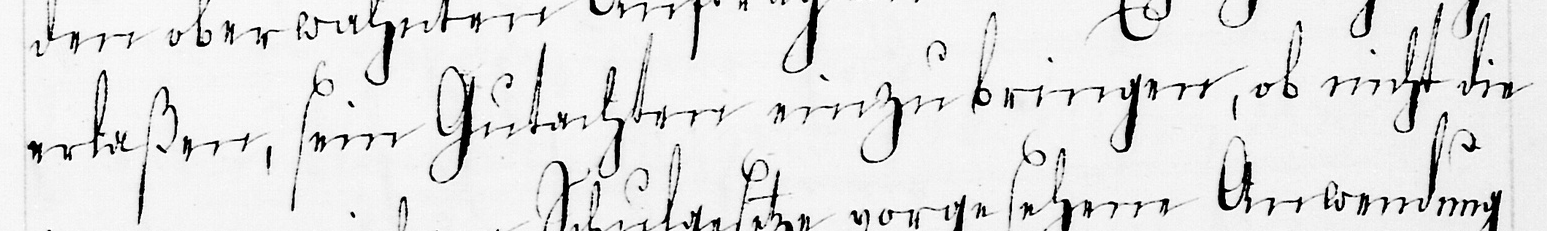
erlaßen, sein Gutachten einzubringen, ob nicht die
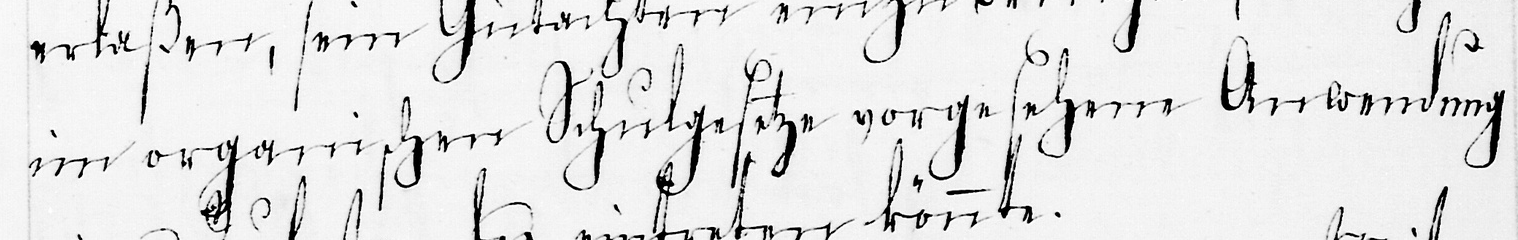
im organischen Schulgesetze vorgesehene Anwendung
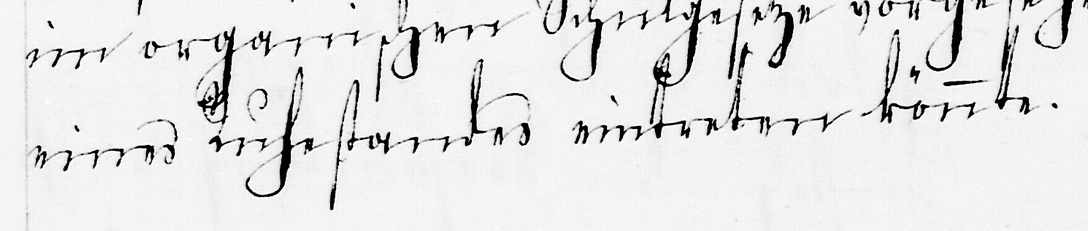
eines Ruhestandes eintreten könnte.
